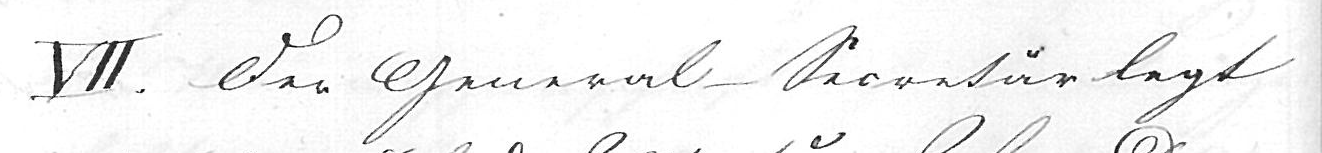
VII. Der General-Secretär legt
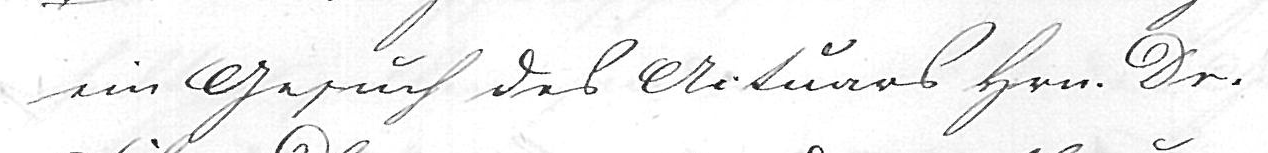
ein Gesuch des Actuars Hrn. Dr.
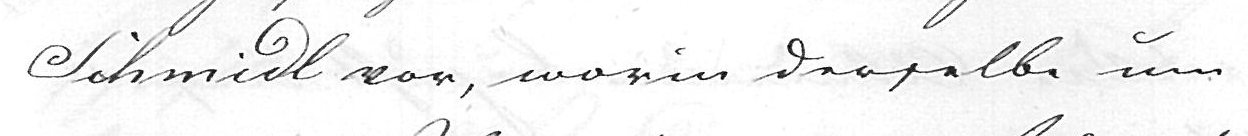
Schmidl vor, worin derselbe um
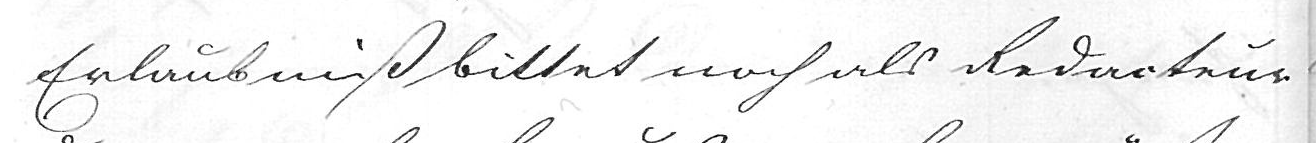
Erlaubniß bittet noch als Redacteur
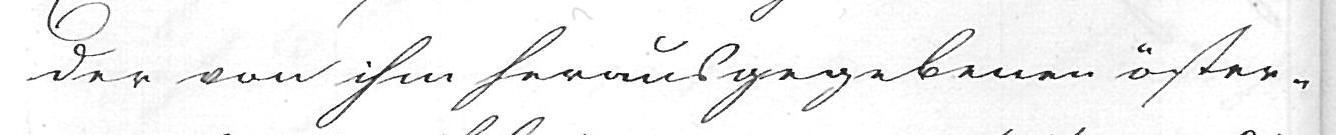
der von ihm herausgegebenen öster-
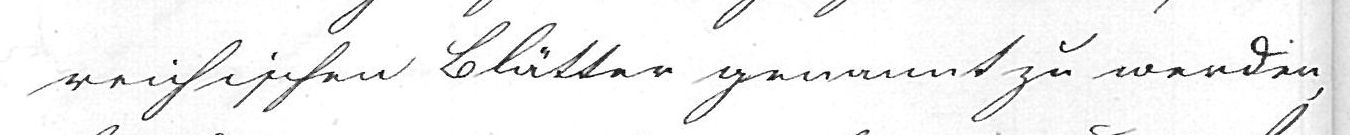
reichischen Blätter genannt zu werden,
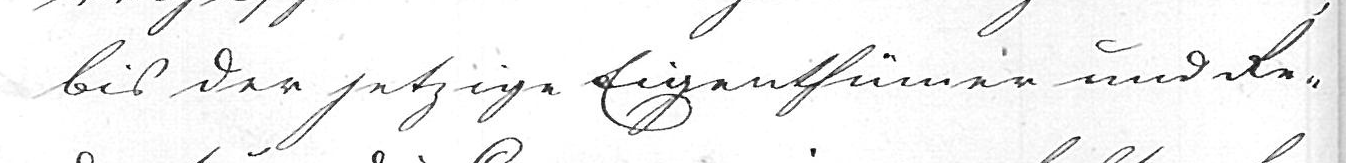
bis der jetzige Eigenthümer und Re-
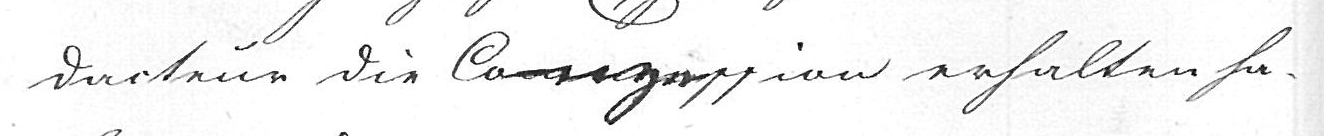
dacteur die Conzession erhalten ha-
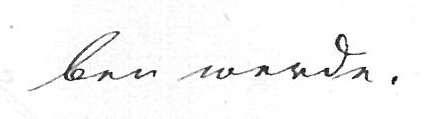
ben werde.
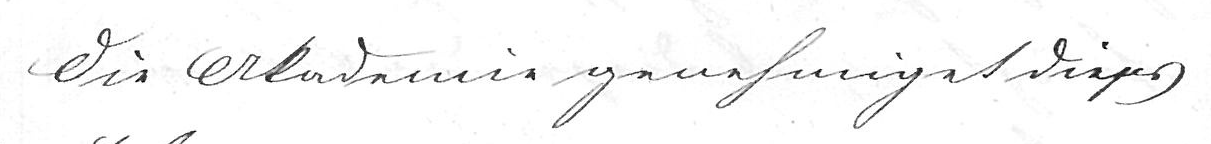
Die Akademie genehmiget dieses
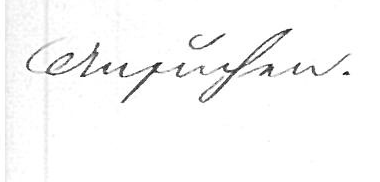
Ansuchen.
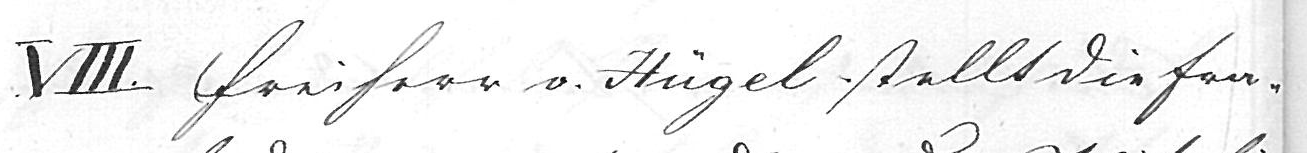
VIII. Freiherr v. Hügel stellt die Fra-
